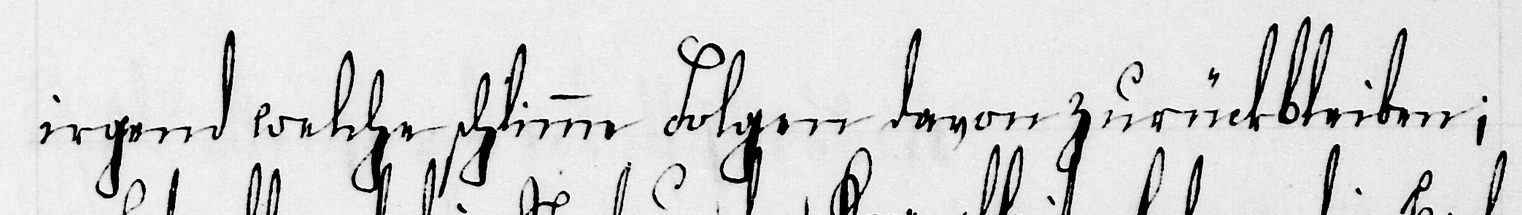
irgend welche schlimme Folgen davon zurückbleiben;
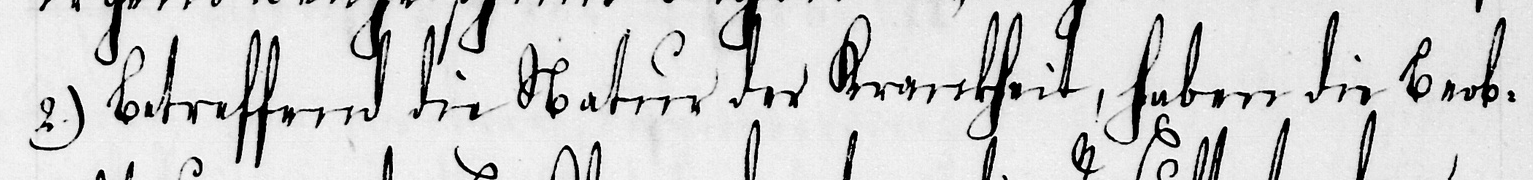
2.) betreffend die Natur der Krankheit, haben die Beob¬
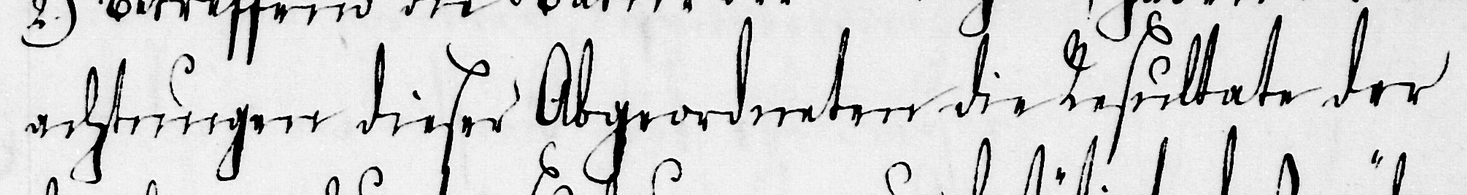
achtungen dieser Abgeordneten die Resultate der
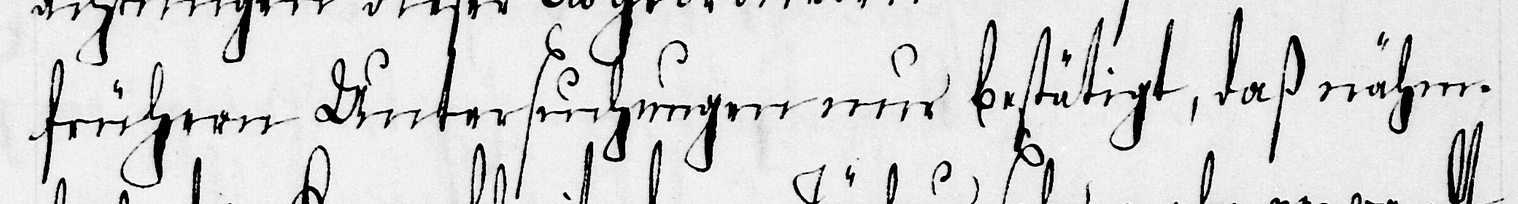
frühern Untersuchungen nur bestätigt, daß nähm¬
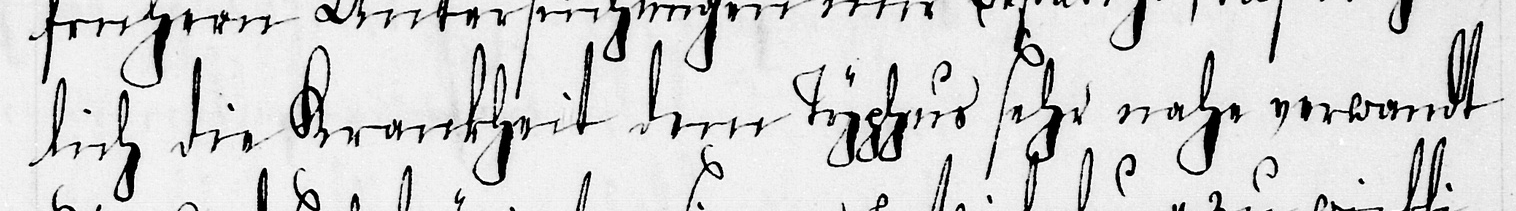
lich die Krankheit dem Typhus sehr nahe verwandt
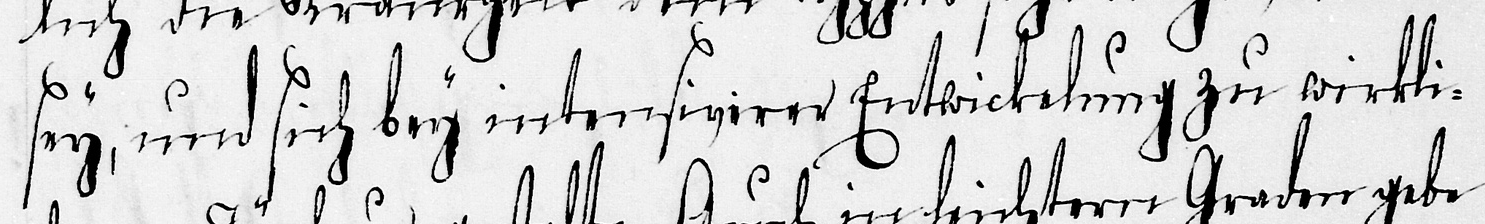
sey, und sich bey intensiverer Entwickelung zu wirkli¬
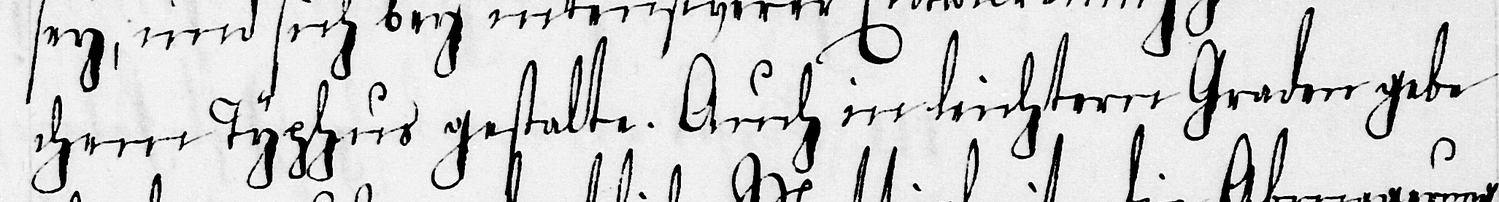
chem Typhus gestalte. Auch in leichtern Graden gebe
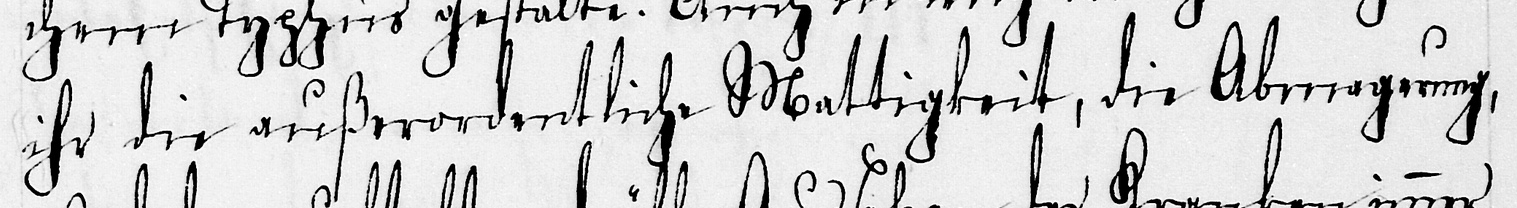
ihr die außerordentliche Mattigkeit, die Abmagerung,
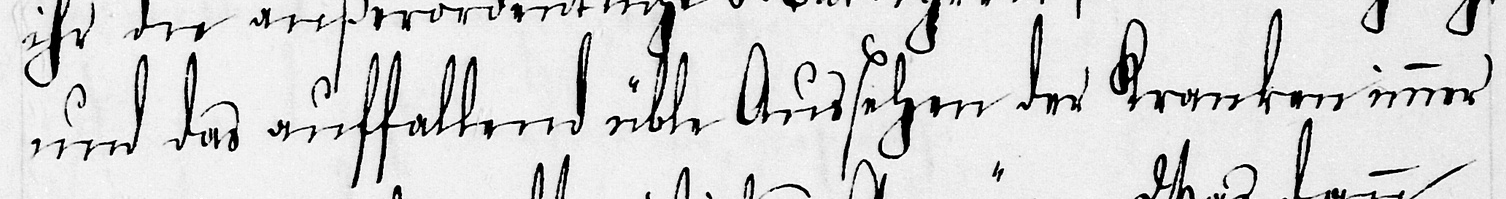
und das auffallend üble Aussehen der Kranken immer
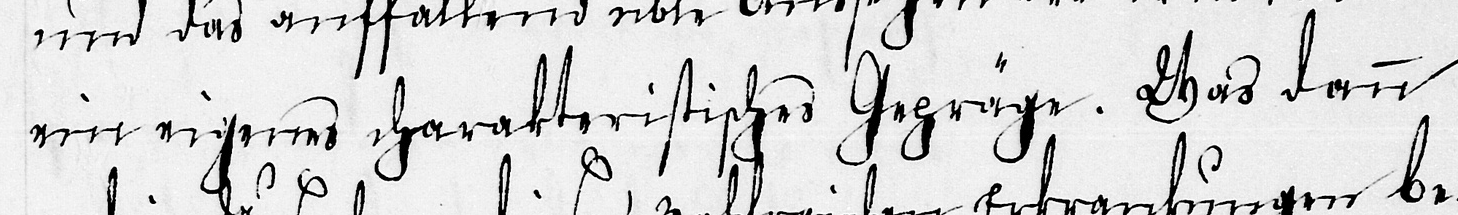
ein eigenes charakteristisches Gepräge. Was dann
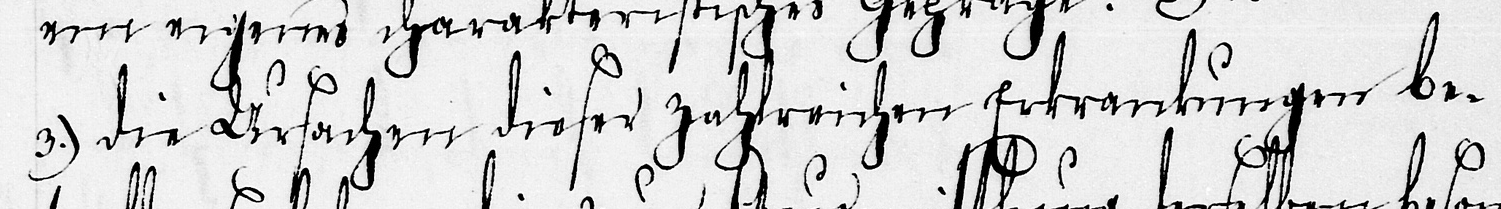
3.) die Ursachen dieser zahlreichen Erkrankungen bet¬
